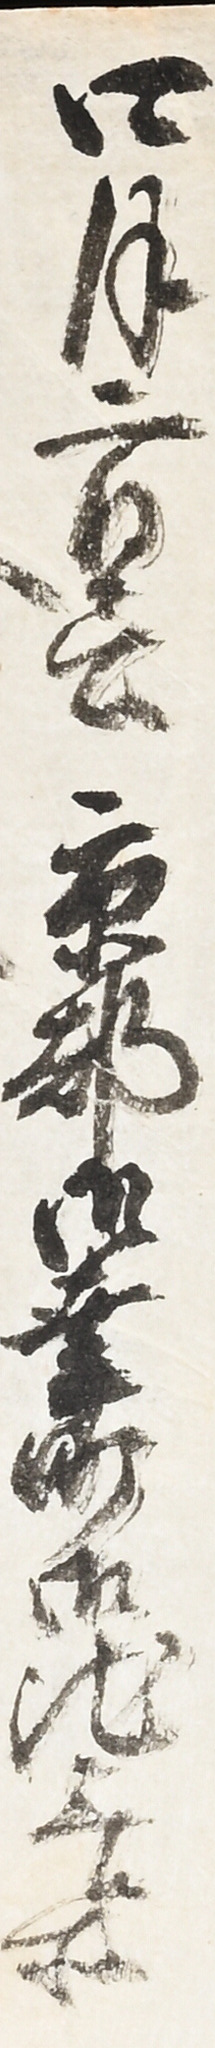四月二日着京都御幸町御池上ル所
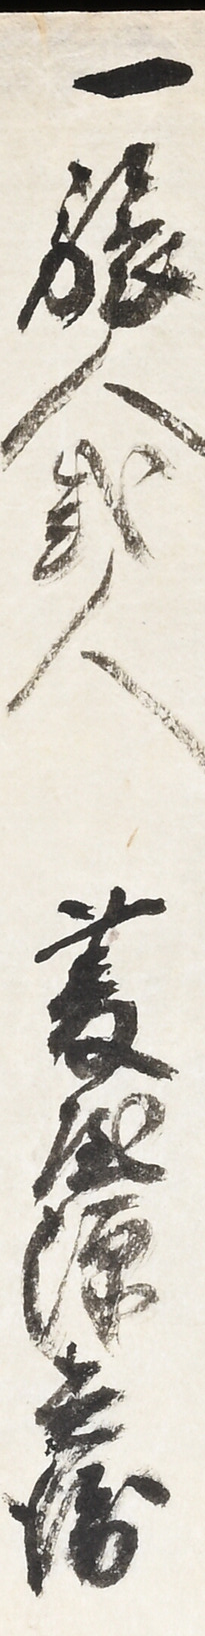一旅人弐人菱屋源兵衛
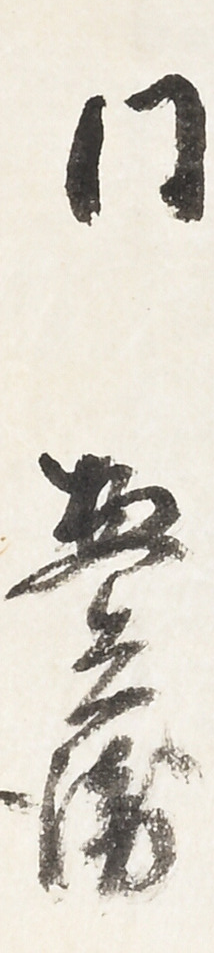同惣兵衛
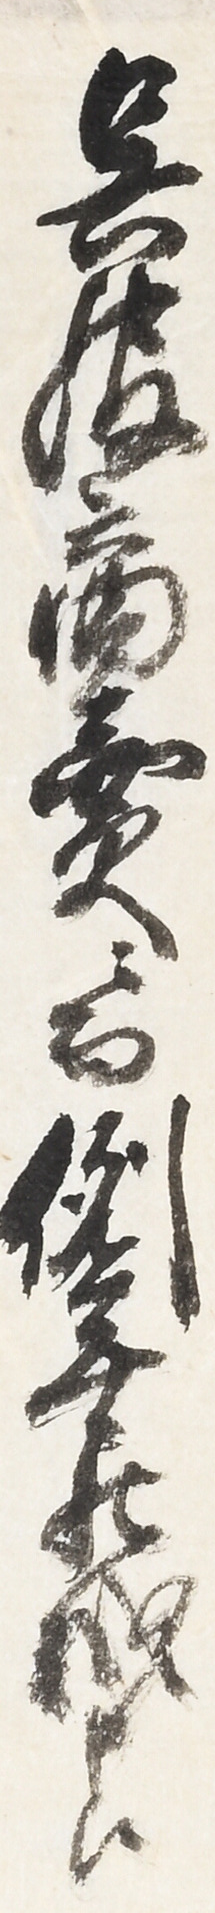呉服商売ニ而例年罷越申候
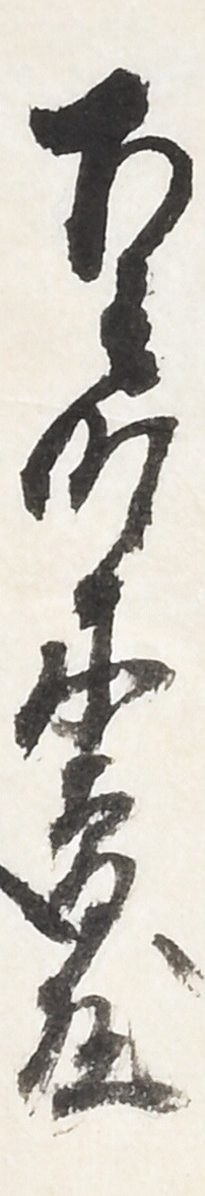下モ町木曽屋
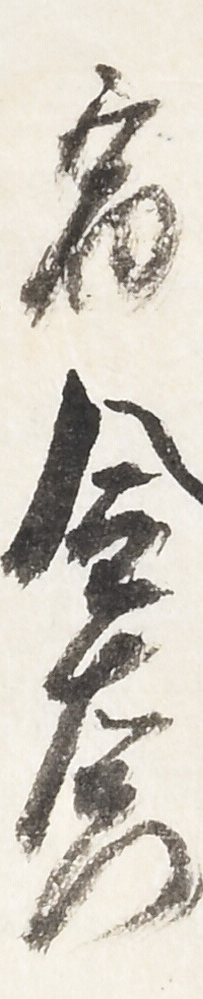宿金右衛門
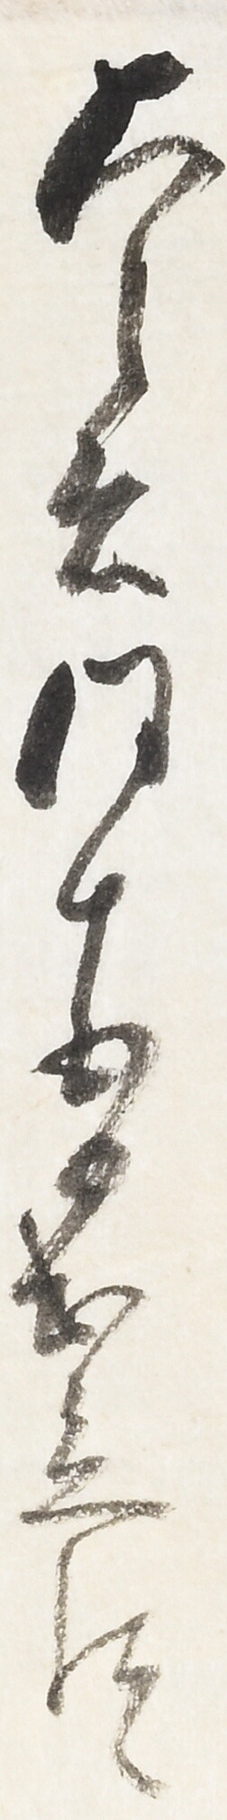右之者同十五日出立仕候
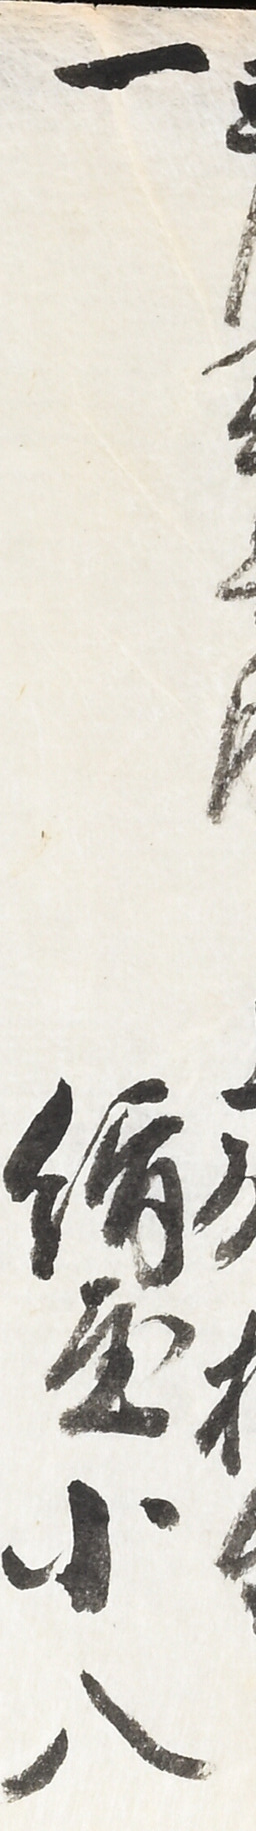一絹屋小八
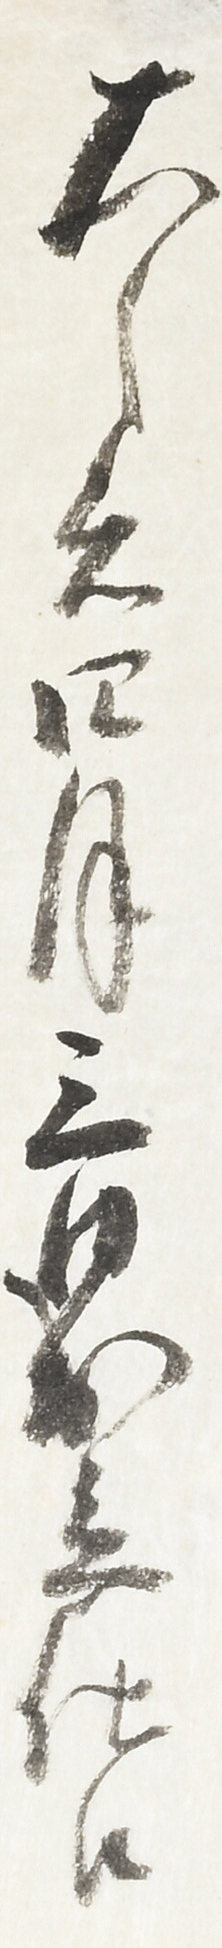右之者四月三日出立仕候
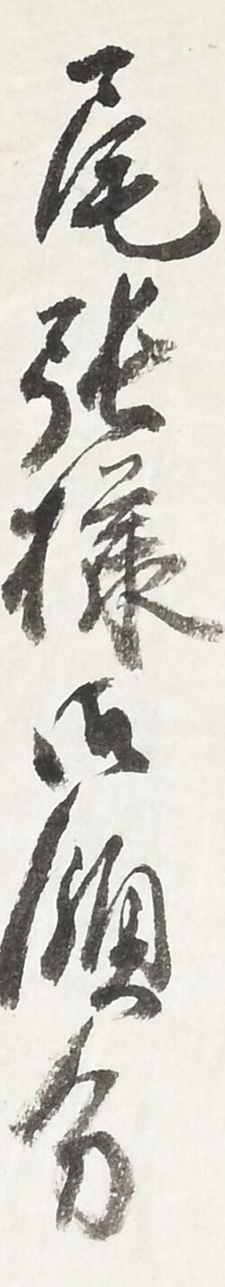尾張様御領分
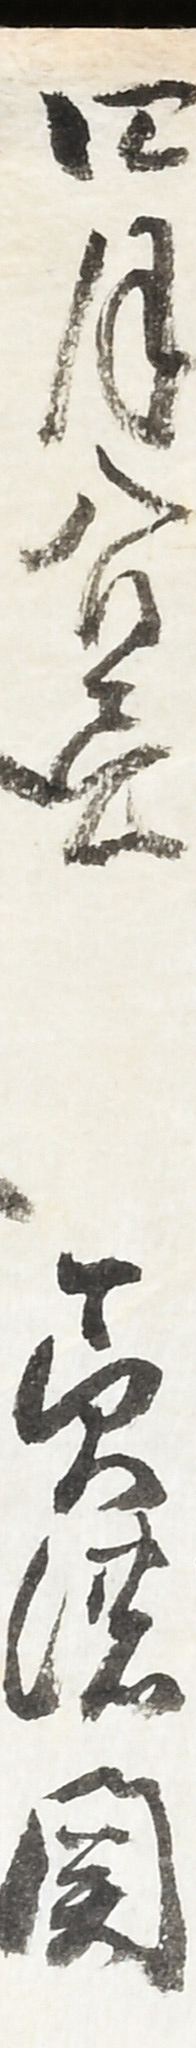四月八日着美濃関
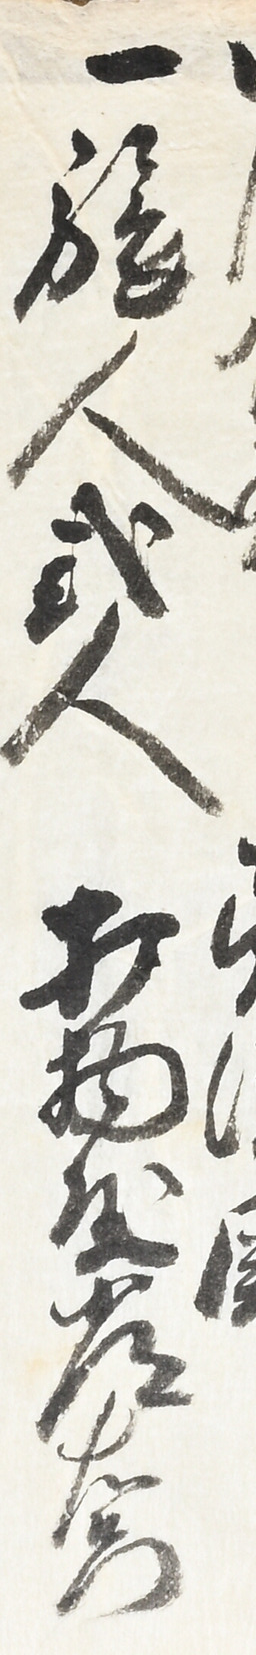一旅人弐人打物屋常右衛門
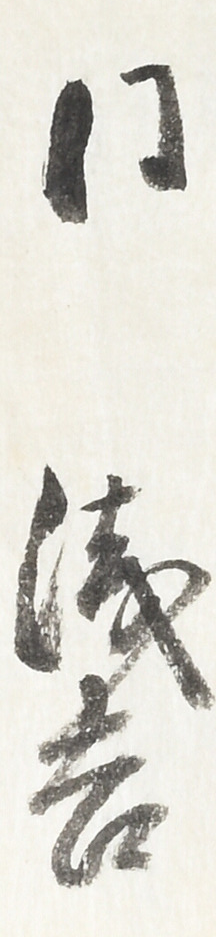同浅吉

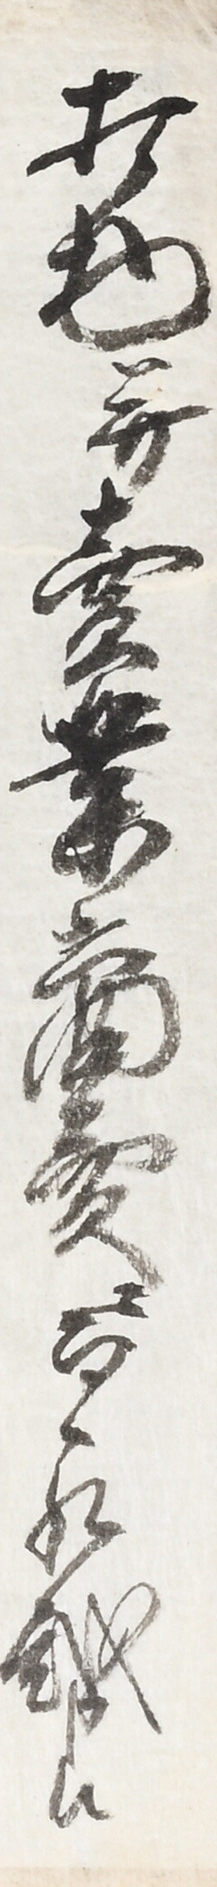打物并売業商売ニ而罷越申候
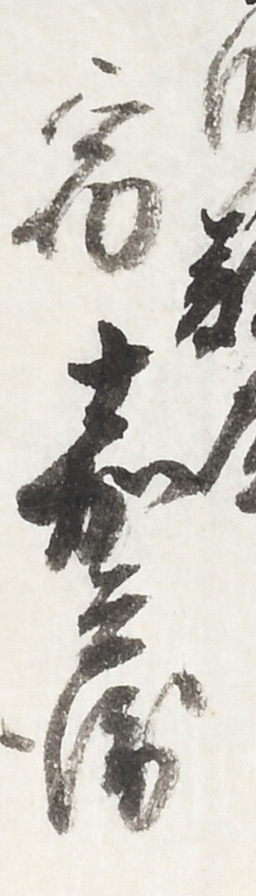宿嘉兵衛
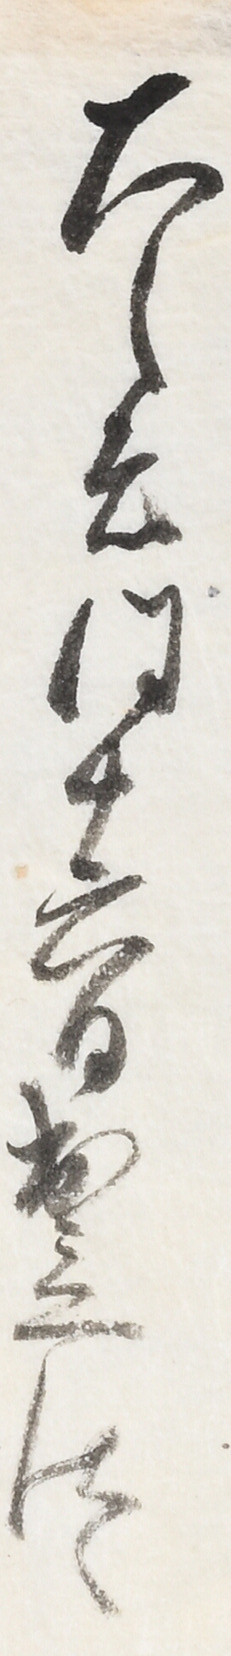右之者同十六日出立仕候
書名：旅人泊控帳
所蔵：伊那市立高遠町図書館・合同会社AMANE
